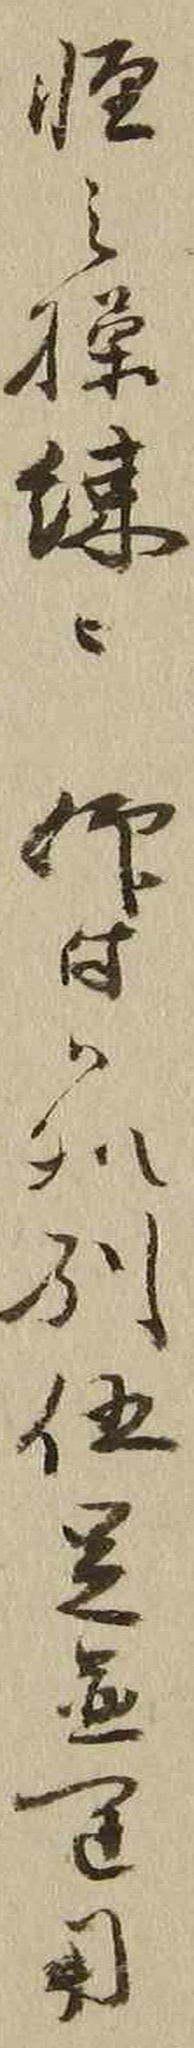軽之操錬被仰付候処列伍足並運用
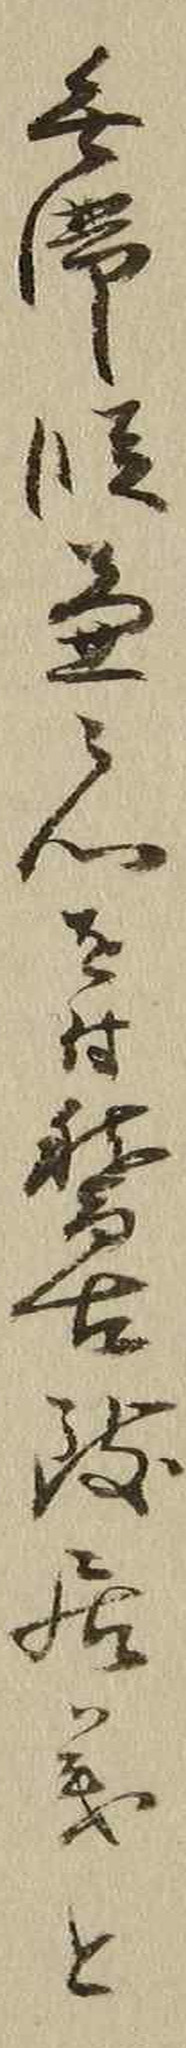無滞段兼々心を付稽古致居候義と
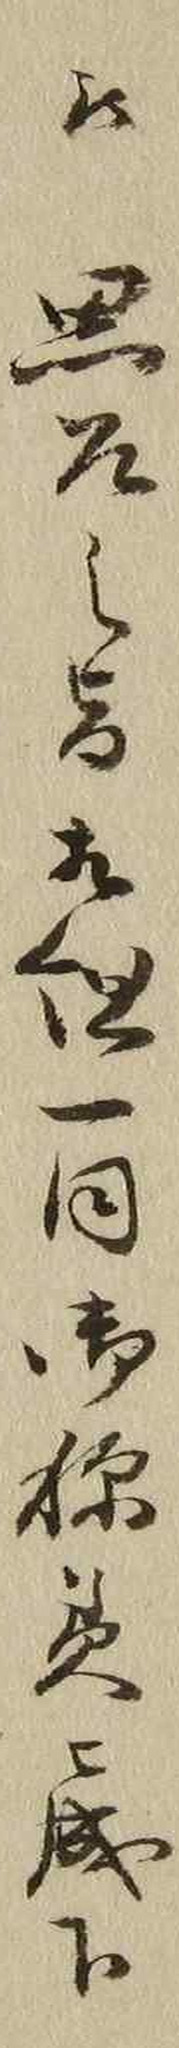被思召之旨相組一同御称美被成下
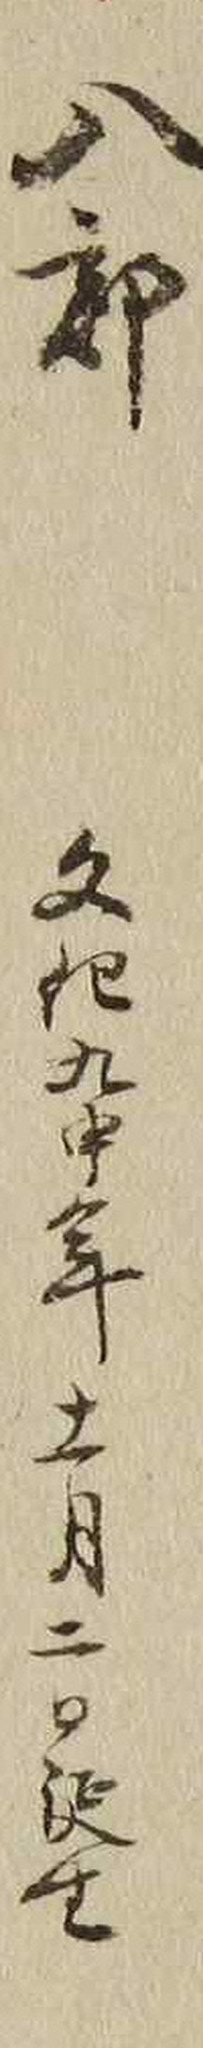八郎文化九申年十一月二日誕生
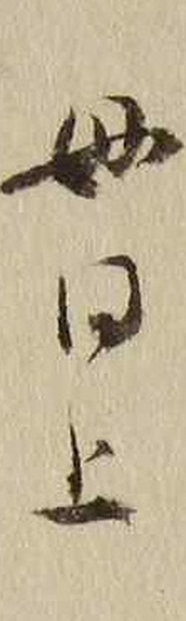母同上
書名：諸士系譜　巻之232　け之部1
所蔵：会津若松市立会津図書館
